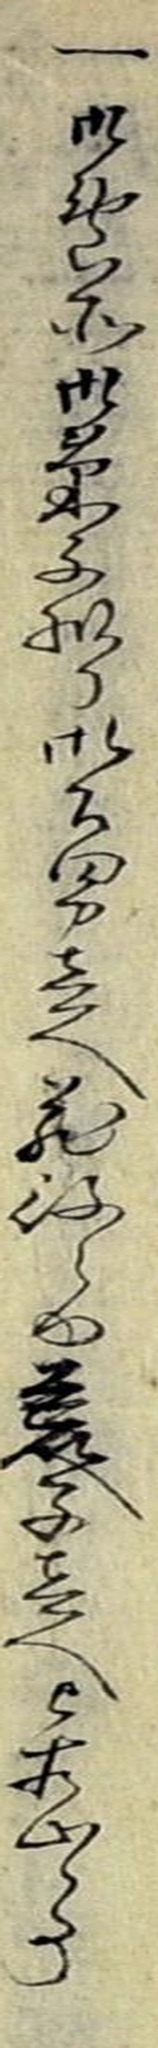一御台所御菓子掛り御下男壱人蔵役之内荒子壱人被相止候事
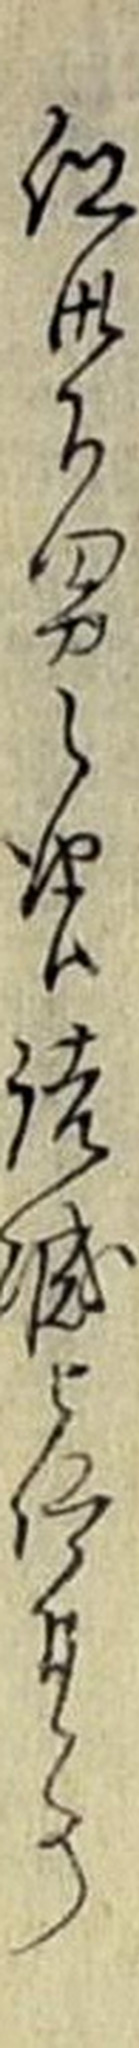但御下男之儀は詰減被仰付候事
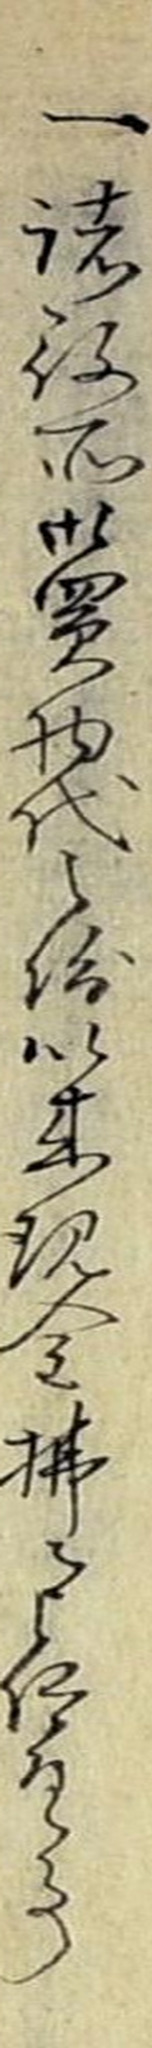一諸役所御買物代之儀以來現金払に被仰付候事
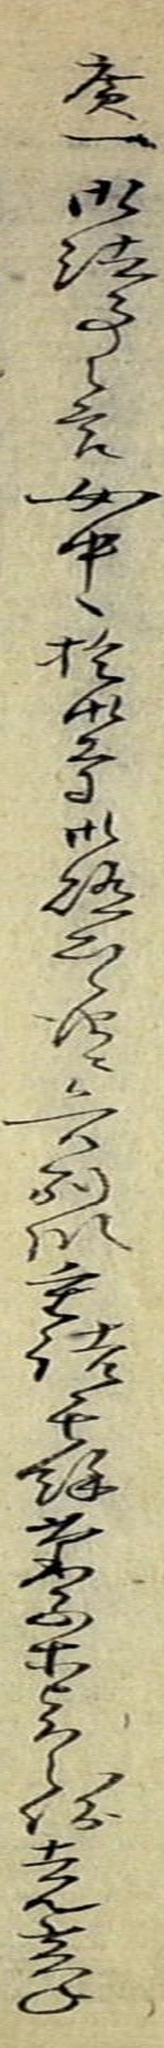廣一御法事之節女中へ於御寺御賄出候儀に候へは別段重詰其餘菓子等被下候儀去ル亥年
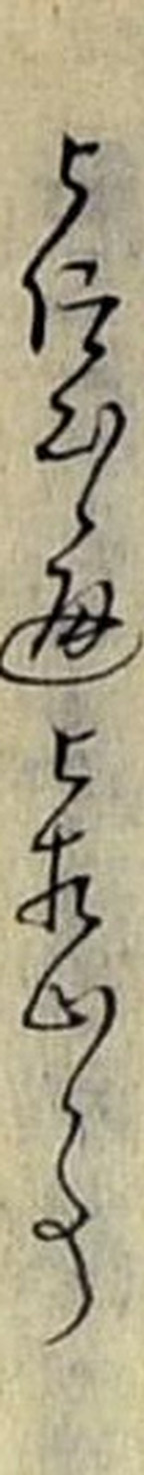被仰出候通被相止候事
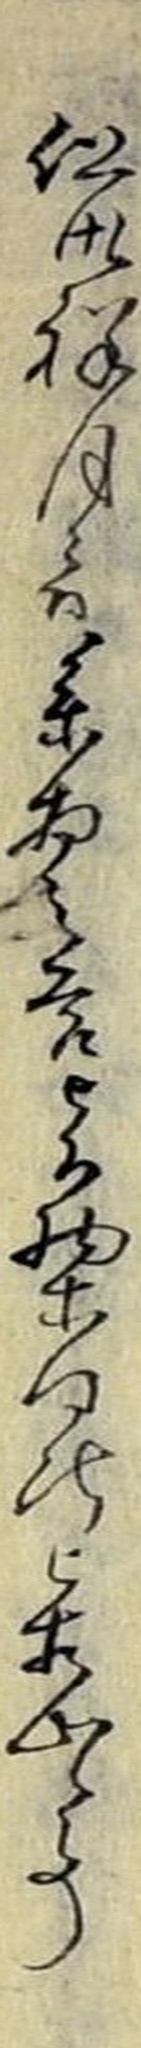但御祥月に付参拝之節被下物等同断被相止候事
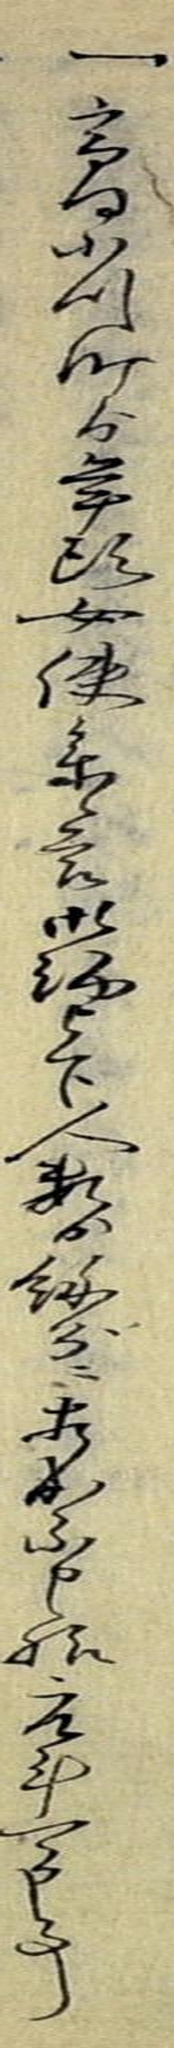一髙田小川町ゟ年頭女使参候節御酒被下人数ゟ余分に相成不申様取斗可申事
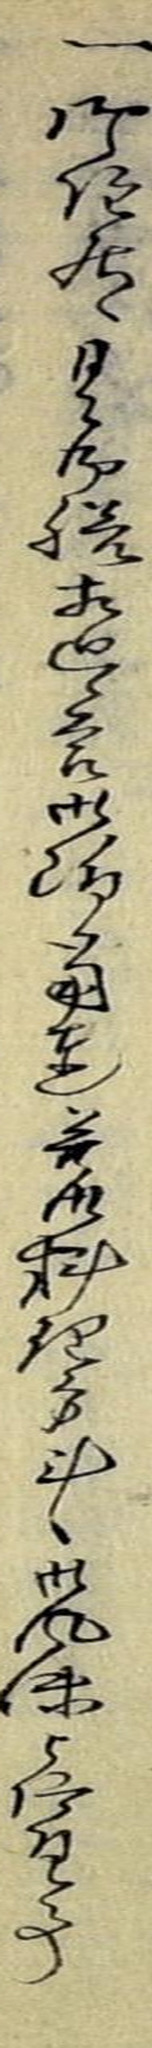一御住居へ日々御膳相廻り候節御附御用達并御料理方斗へ御風味被仰付候事
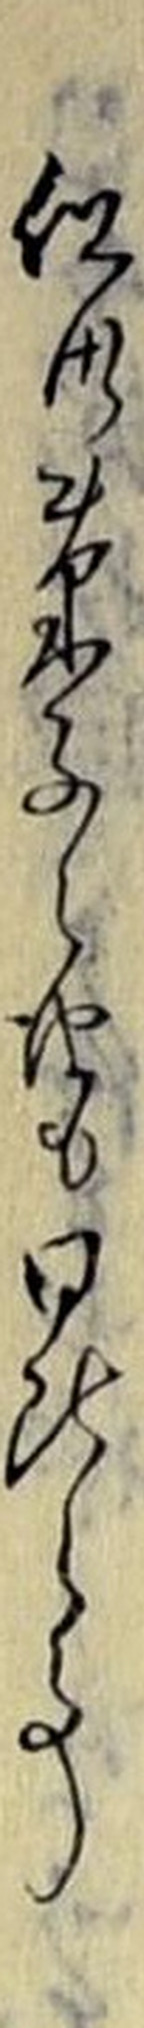但御菓子之儀も同断之事
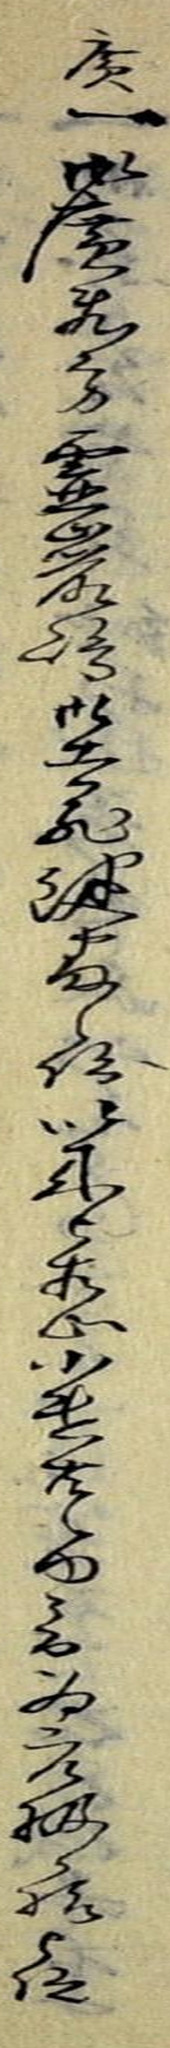廣一御広敷方霊厳嶋御土蔵鍵番之儀以來被相止小遣共之内に而為取扱候様被仰
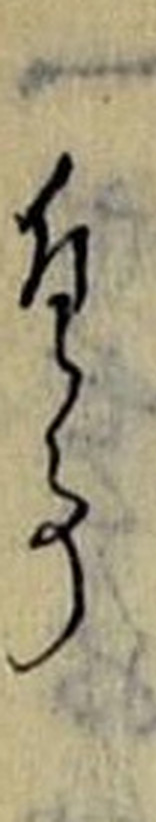付候事
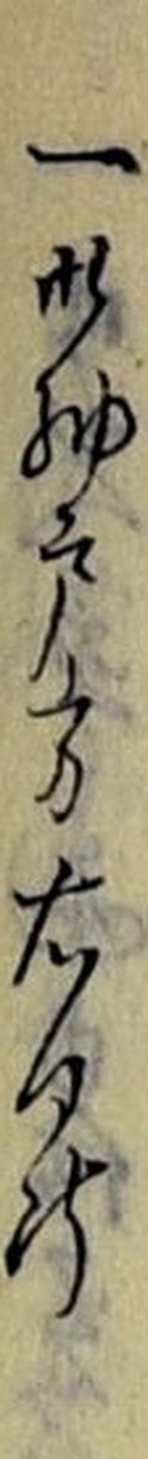一御納戸方右同断
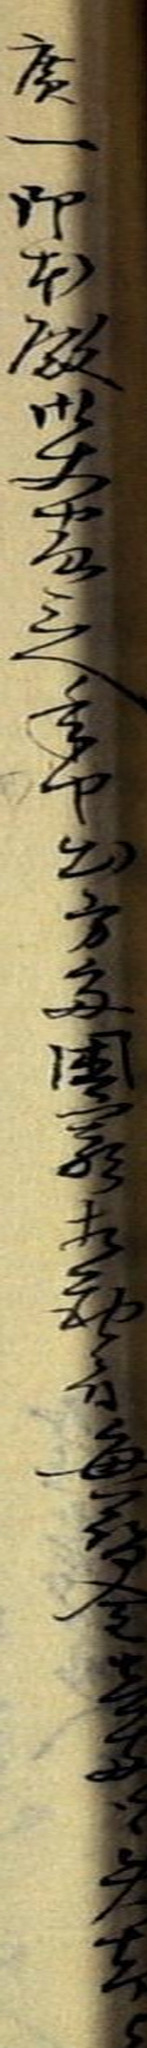廣一御本殿御使番三人年中出方多困窮相勤候に付毎暮金壱両つヽ失却被下候処
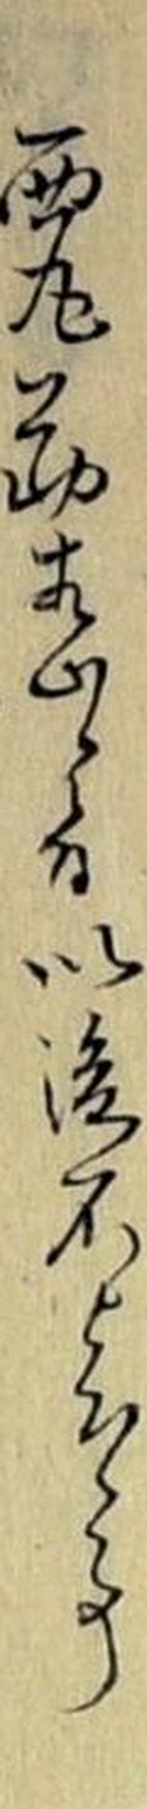西丸勤相止候に付以後不被下候事
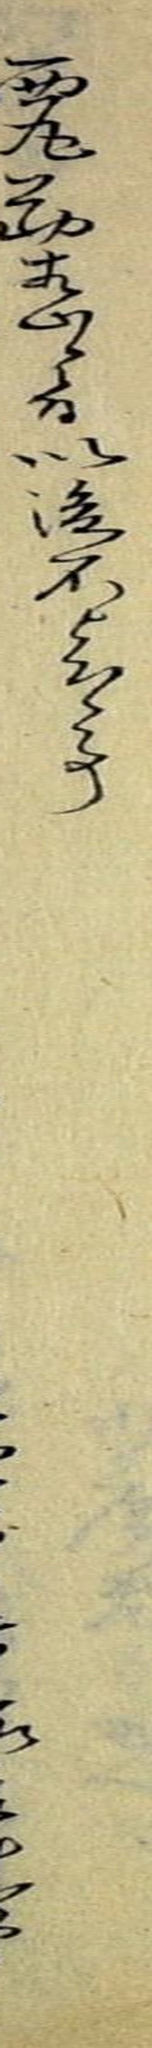西丸勤相止候に付以後不被下候事
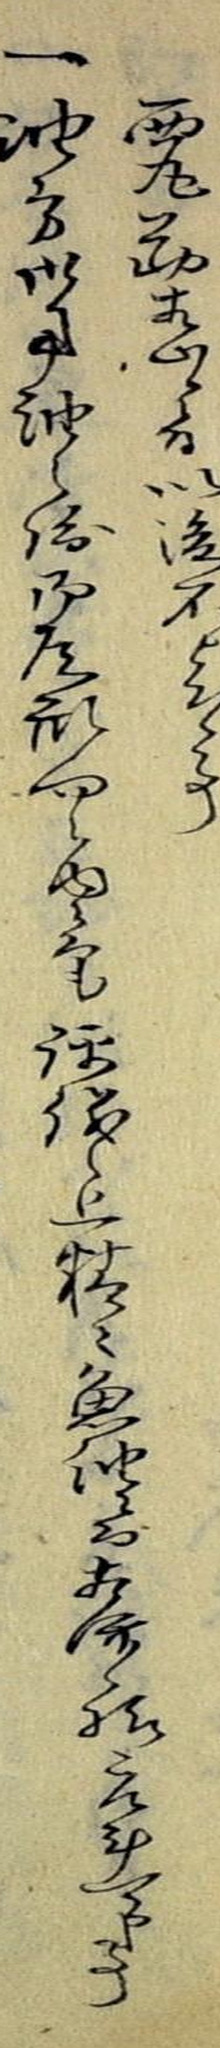一油方御用油之儀御屋形向之内に而も評議之上精々魚油に而相済候様取斗可申事
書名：命令之部 六
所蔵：福井県文書館 Fukui Prefectural Archives
